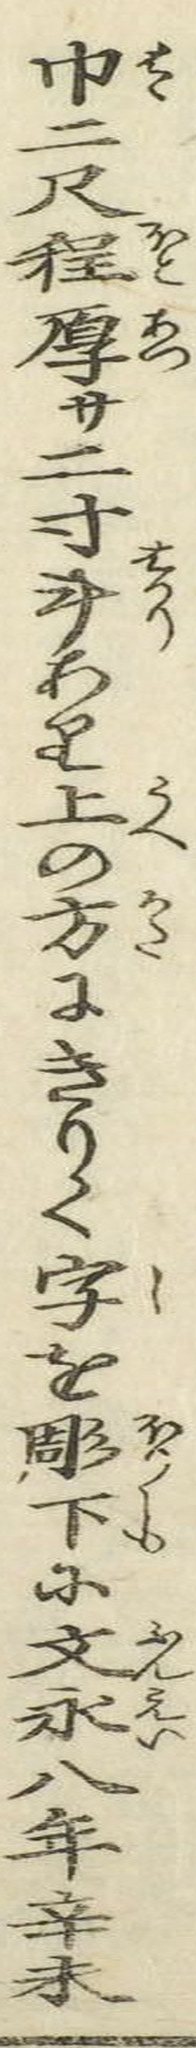巾二尺程厚サ二寸斗あり上の方にきりく字を彫下に文永八年辛未
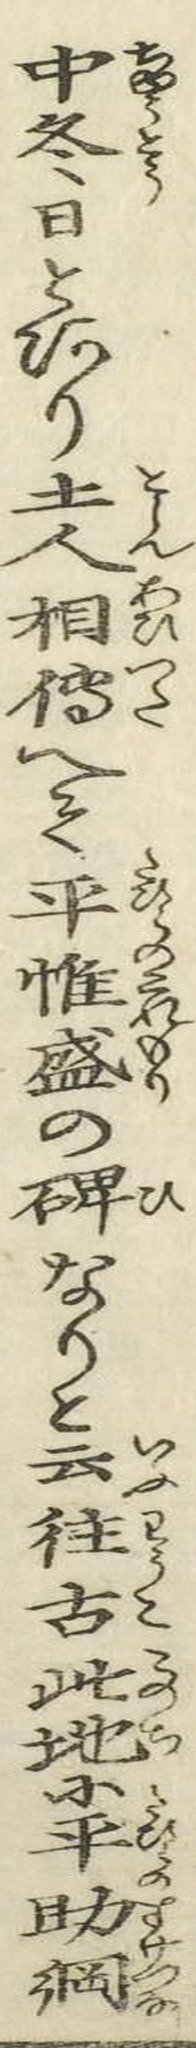中冬日とあり土人相伝へて平惟盛の碑なりと云往古此地に平助綱
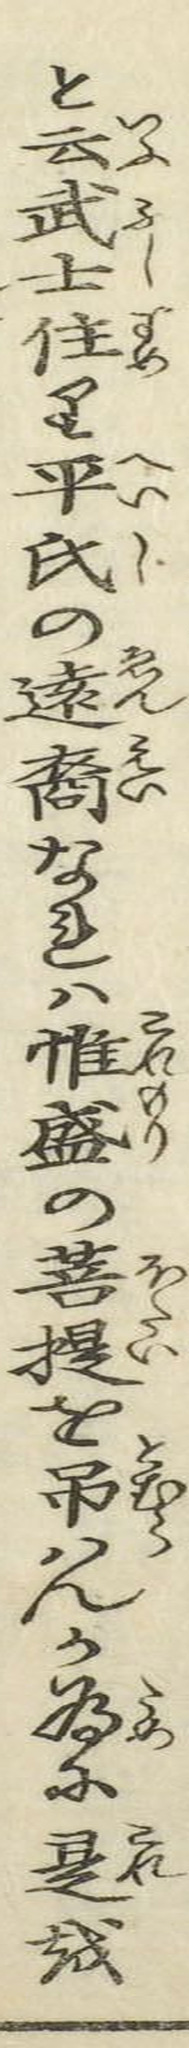と云武士住り平氏の遠裔なれは惟盛の菩提を吊はんか為に是を
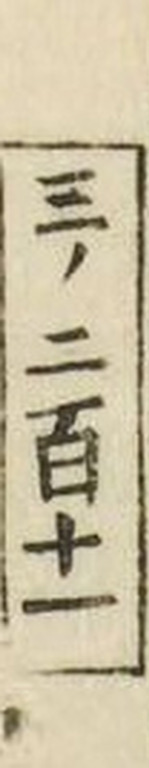三ノ二百十一
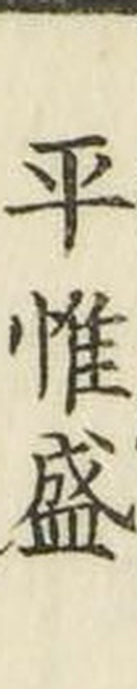平惟盛
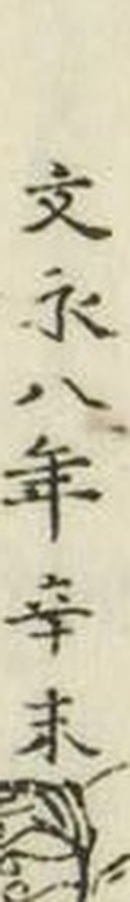文永八年辛未
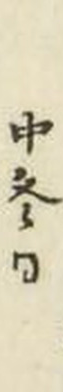中冬日

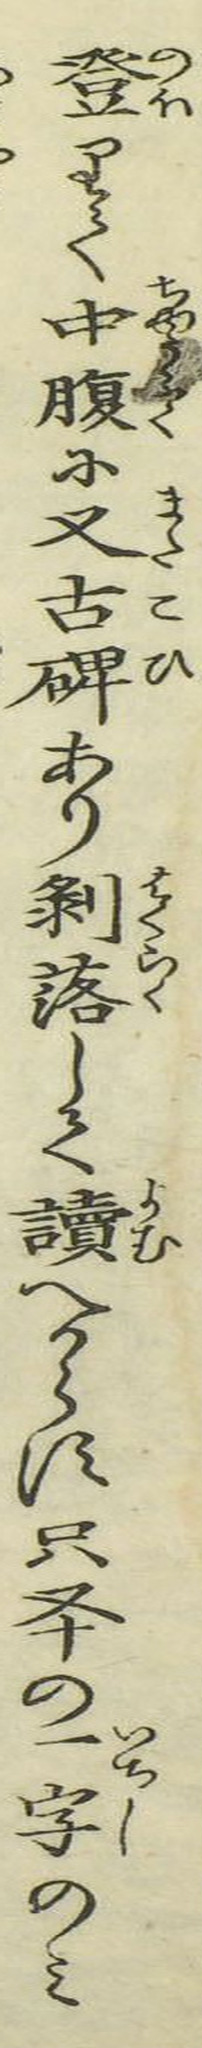登りて中腹に又古碑あり剥落して読へからす只の一字のみ
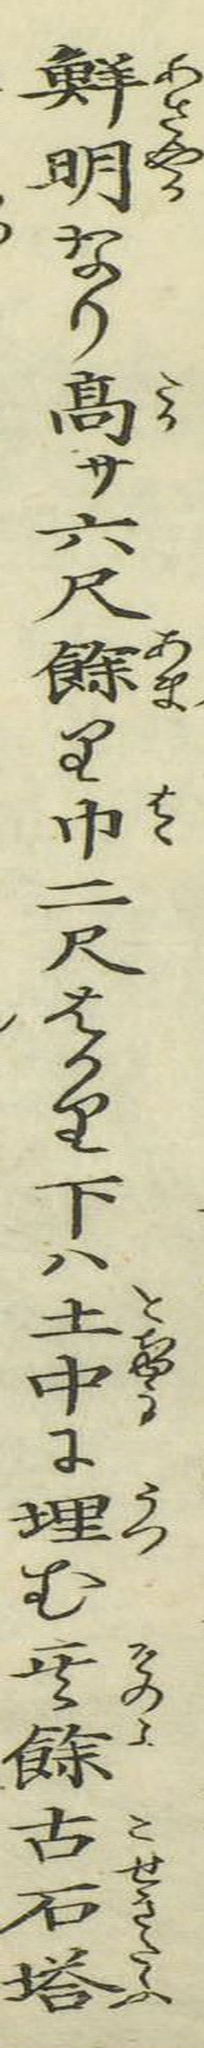鮮明なり高サ六尺余り巾二尺はかり下は土中に埋む其余古石塔
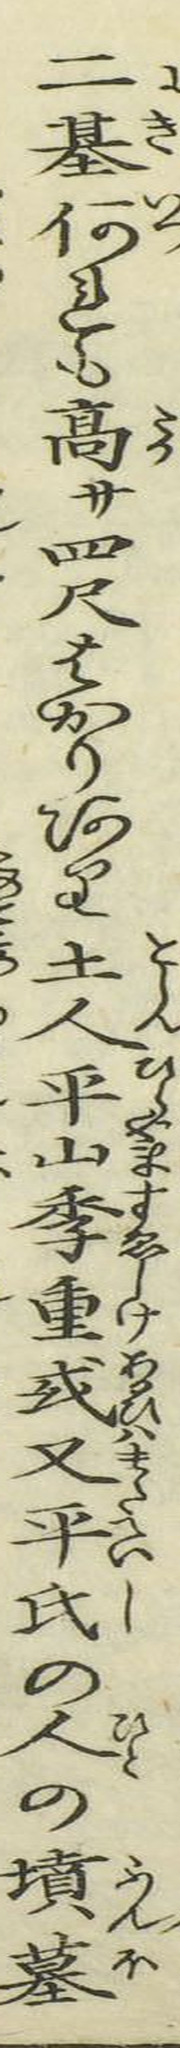二基何れも高サ四尺はかりあり土人平山季重或又平氏の人の墳墓
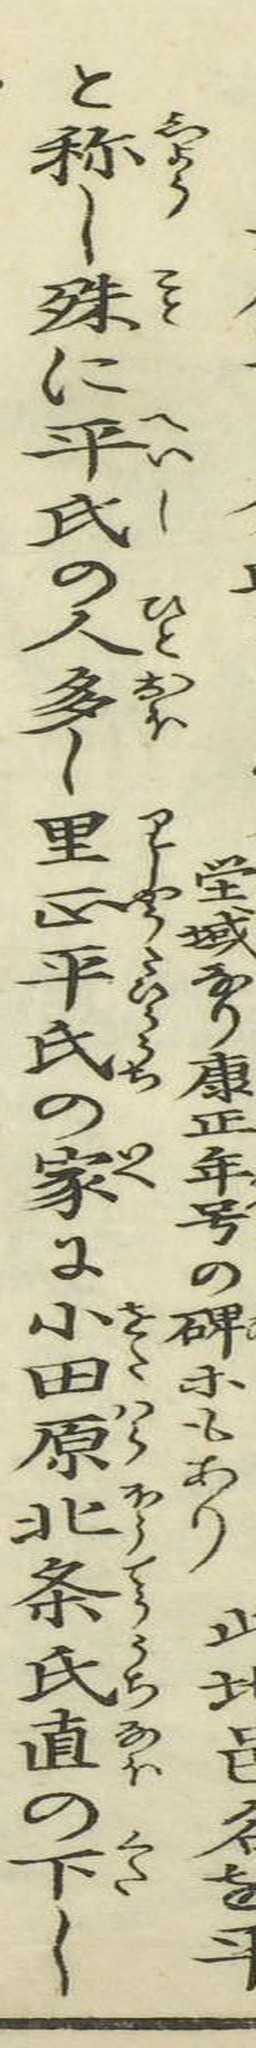と称し殊に平氏の人多し里正平氏の家に小田原北条氏直の下し
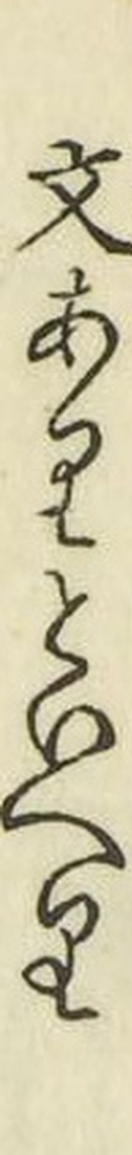文ありといへり
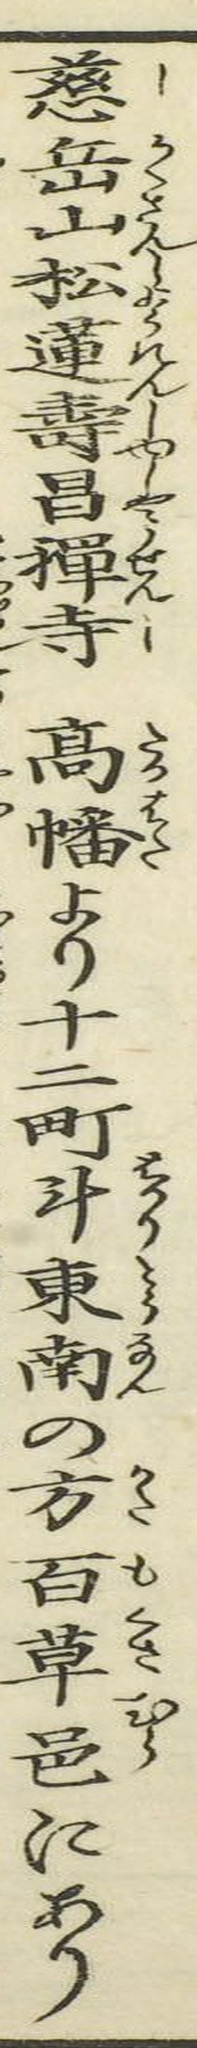慈岳山松蓮寿昌禅寺高幡より十二町斗東南の方百草邑にあり
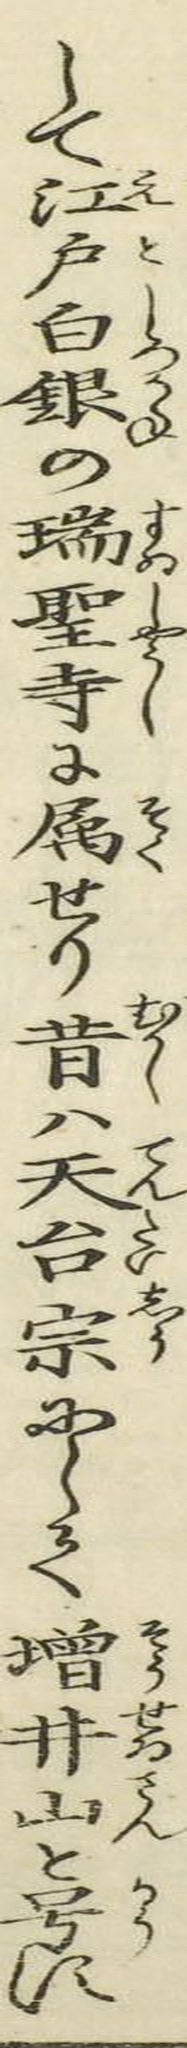して江戸白銀の瑞聖寺に属せり昔は天台宗にして増井山と号す
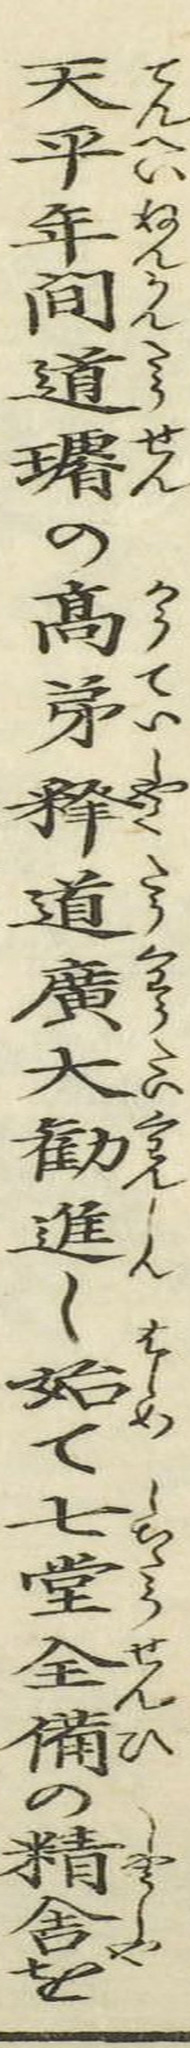天平年間道璿の高弟釋道広大勧進し始て七堂全備の精舎を
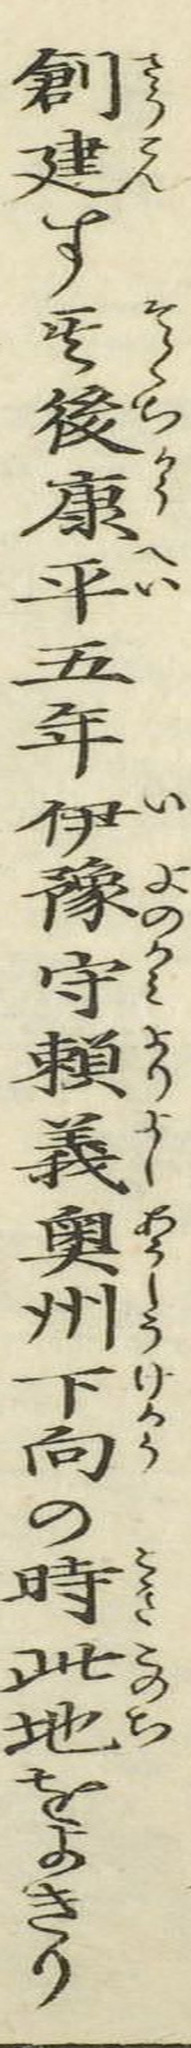創建す其後康平五年伊予守頼義奥州下向の時此地をよきり
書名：江戸名所図会 20巻 巻之10
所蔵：東京学芸大学教育コンテンツアーカイブ
